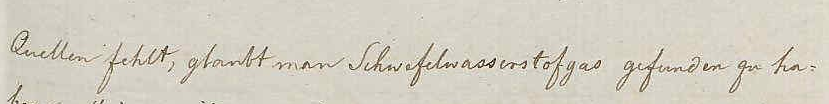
Quellen fehlt, glaubt man Schwefelwasserstofgas gefunden zu ha-
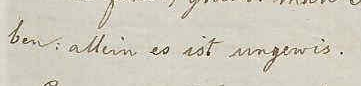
ben: allein es ist ungewis.
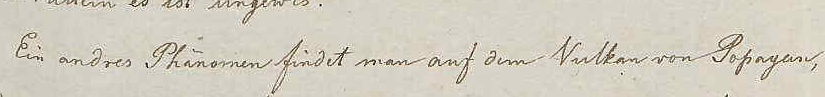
Ein andres Phänomen findet man auf dem Vulkan von Popayan,
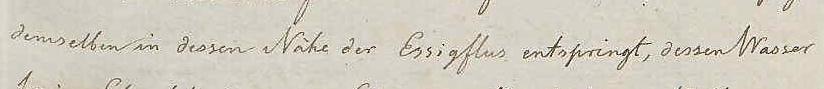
demselben in dessen Nähe der Essigflus entspringt, dessen Wasser
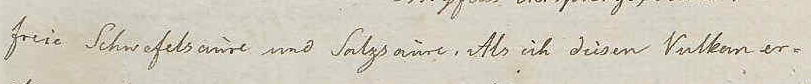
freie Schwefelsäure und Salzsäure. Als ich diesen Vulkan er-
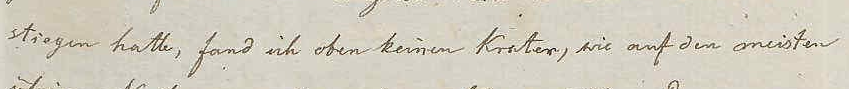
stiegen hatte, fand ich oben keinen Krater, wie auf den meisten
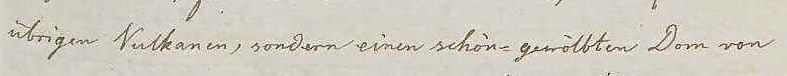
übrigen Vulkanen, sondern einen schön-gewölbten Dom von
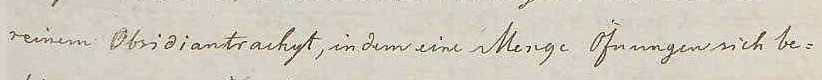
reinem Obsidiantrachyt, in dem eine Menge Öfnungen sich be-
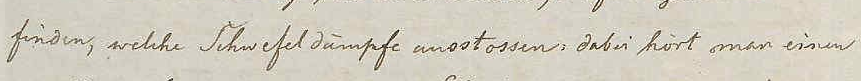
finden, welche Schwefeldämpfe ausstossen: dabei hört man einen
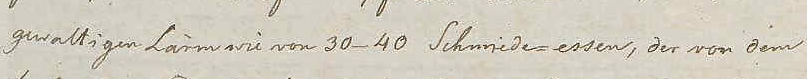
gewaltigen Lärm wie von 30–40 Schmiede-essen, der von dem
